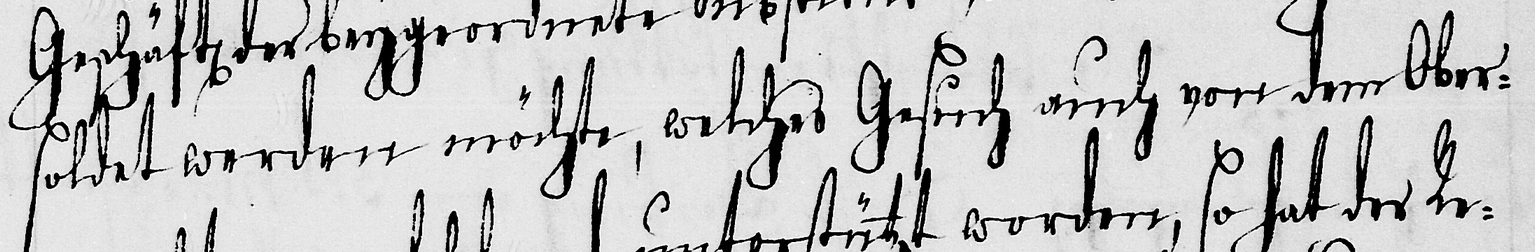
soldet werden möchte, welches Gesuch auch von dem Ober¬
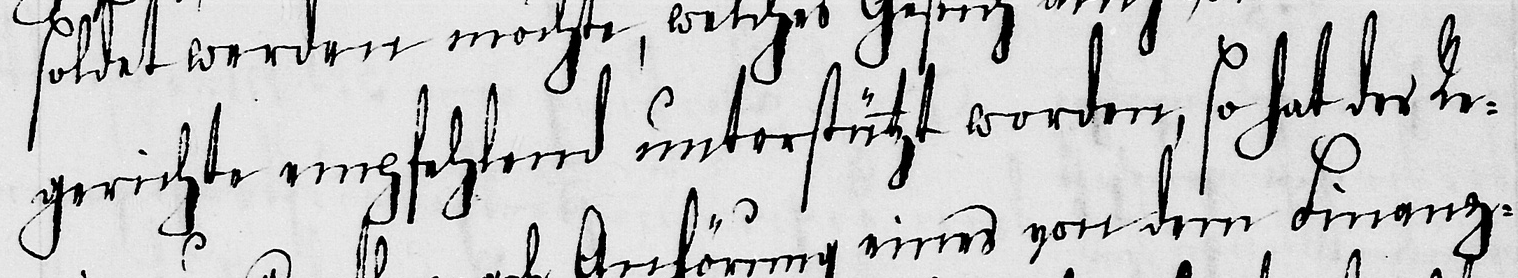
gerichte empfehlend unterstützt worden, so hat der R¬
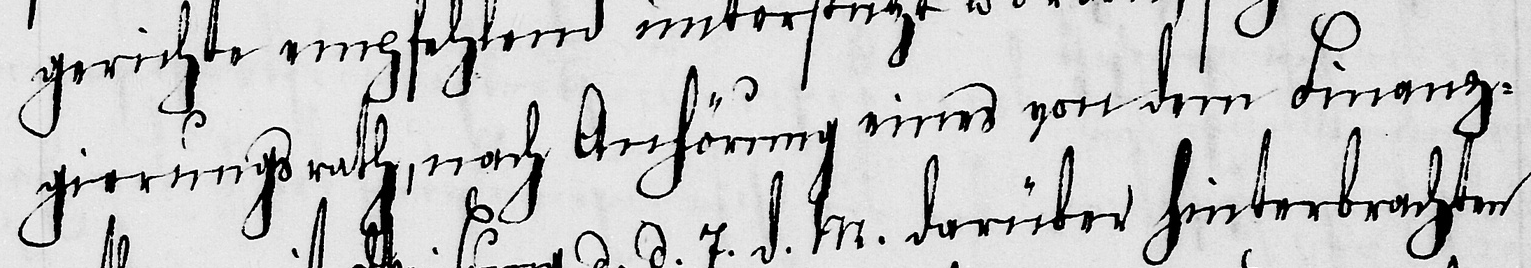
egierungsrath, nach Anhörung eines von dem Finanz¬
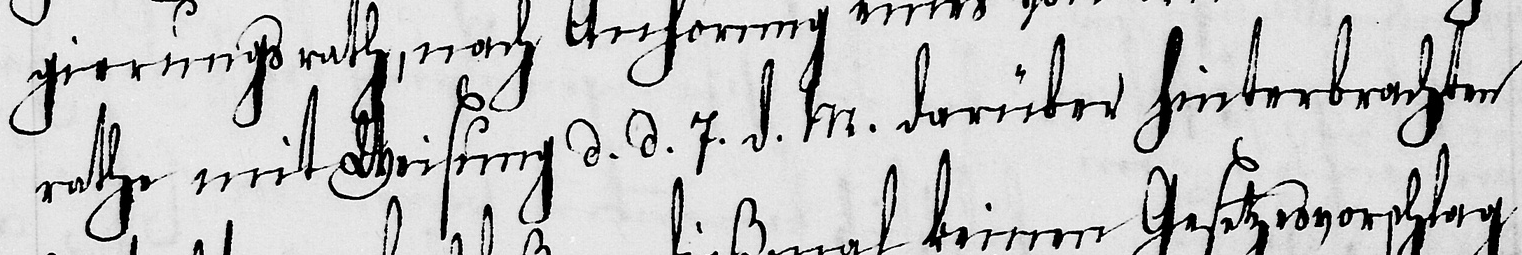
rathe mit Weisung d. d. 7. d. M. darüber hinterbrachten
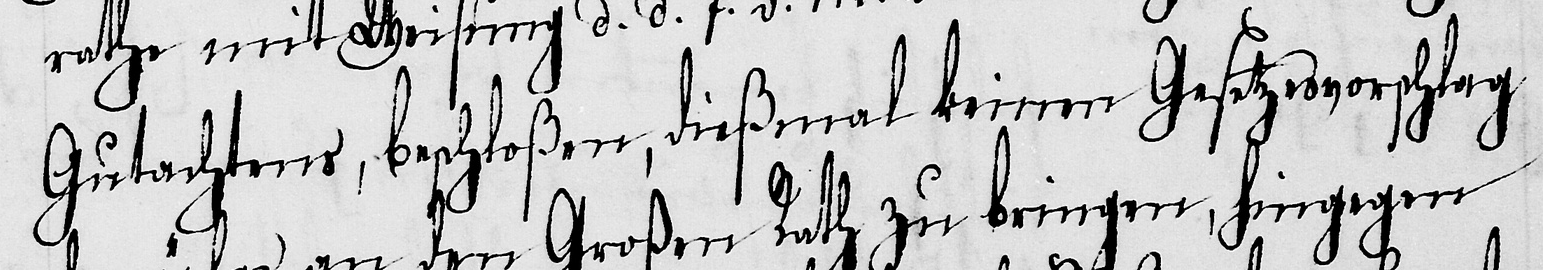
Gutachtens, beschloßen, dießmal keinen Gesetzesvorschlag
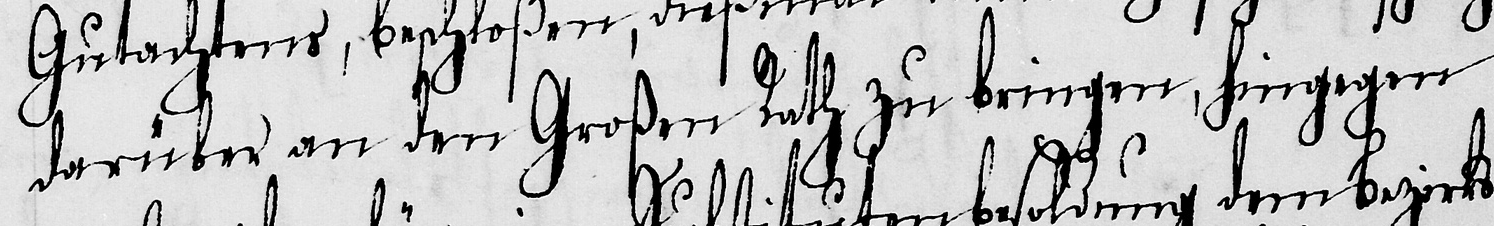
darüber an den Großen Rath zu bringen, hingegen
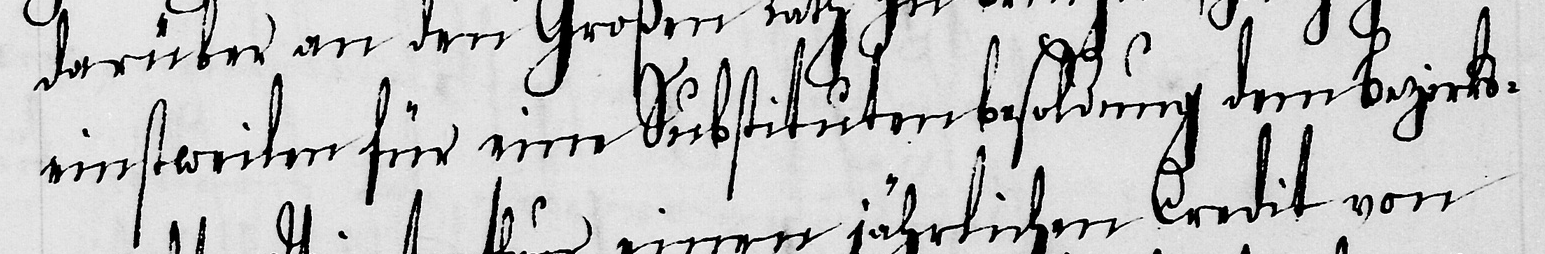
einstweilen für eine Substitutenbesoldung dem Bezirks¬
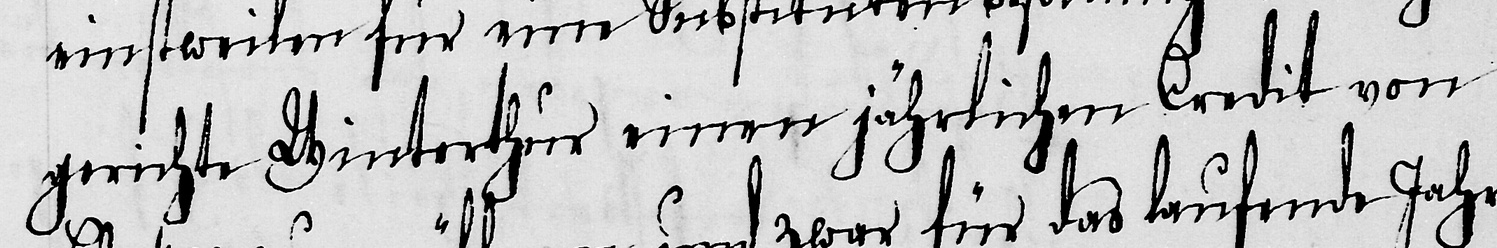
gerichte Winterthur einen jährlichen Credit von
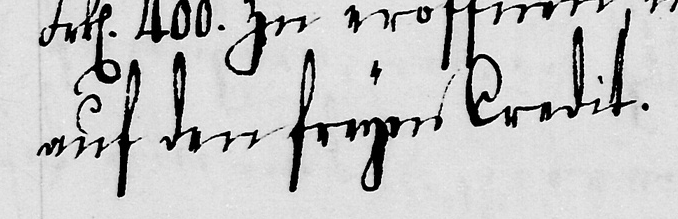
auf den freyen Credit.
